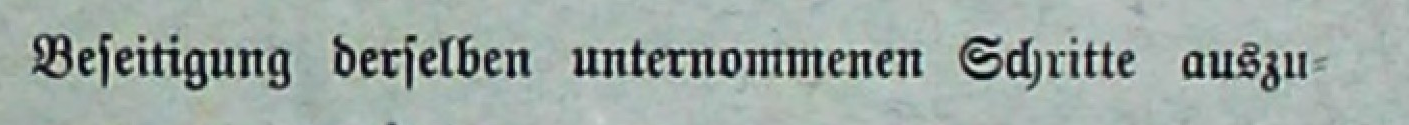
Beseitigung derselben unternommenen Schritte auszu„
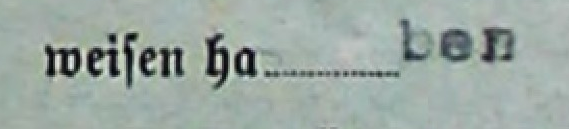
weisen haben
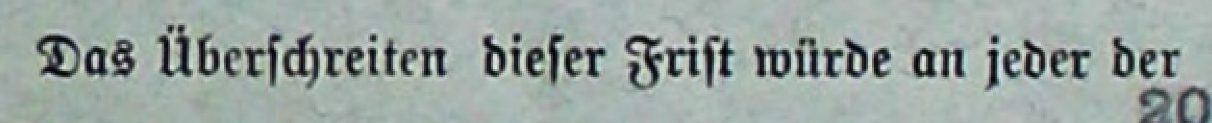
Das Überschreiten dieser Frist würde an jeder der
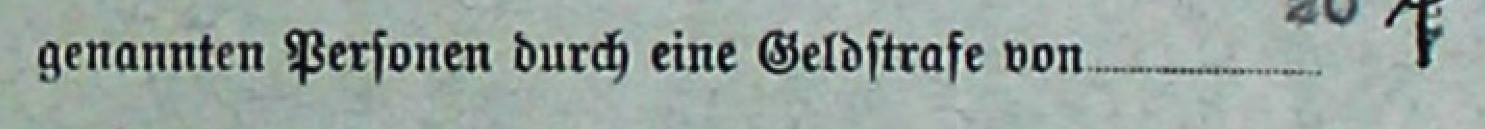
genannten Personen durch eine Geldstrafe von 20K
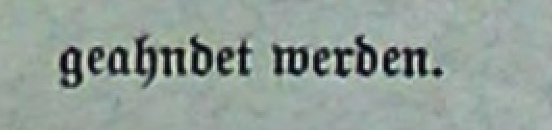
geahndet werden.
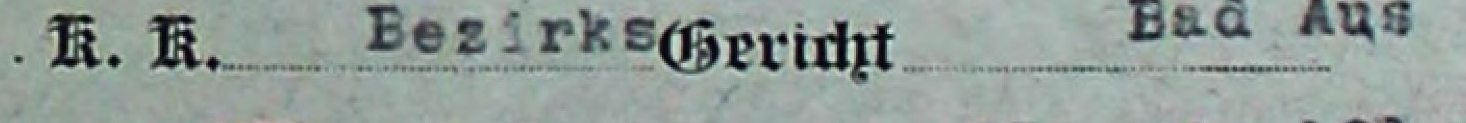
K. K. Bezirks Gericht Bad Aus
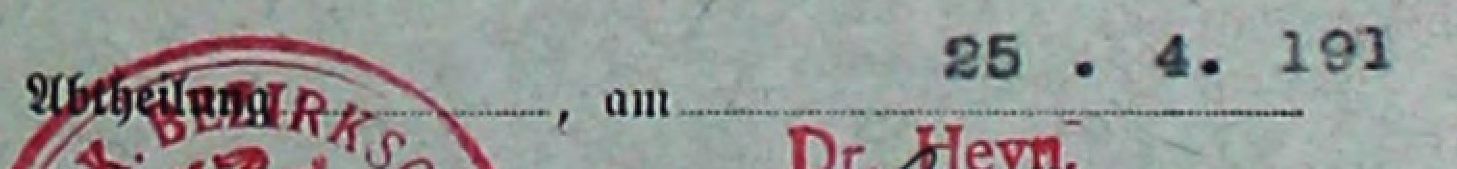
Abtheilung, am 25.4.191
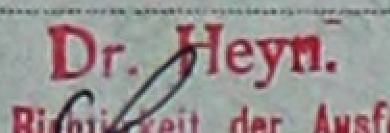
Dr. Heyn.
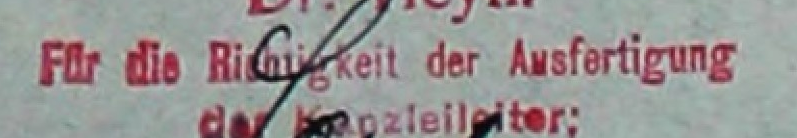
Für die Richtigkeit der Ausfertigung
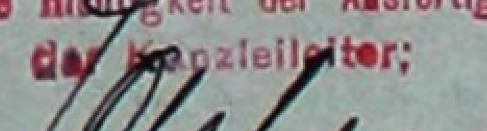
der Kanzleileiter:
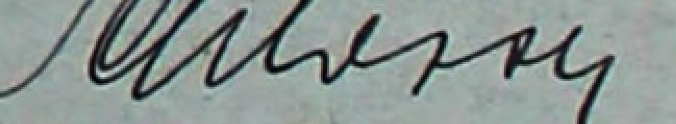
???
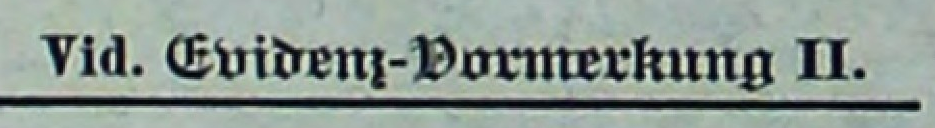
Vid. Evidenz-Vormerkung II.
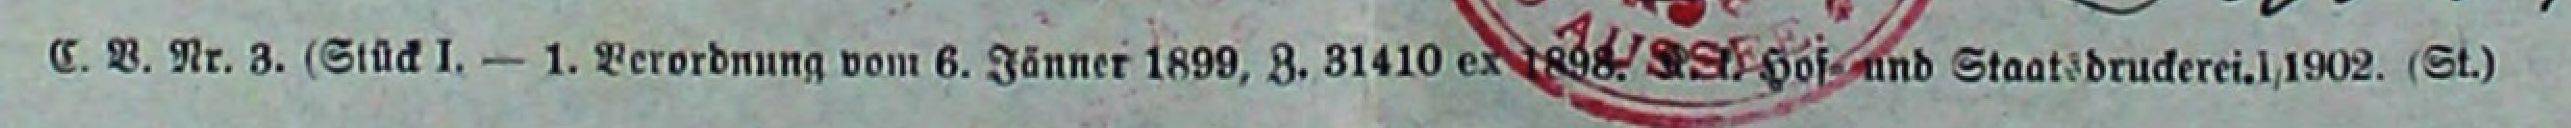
C. V. Nr. 3. (Stück I. — 1. Verordnung vom 6. Jänner 1899, Z. 31410 ex 1898. K. ? Hof- und Staatsdruckerei. I, 1902. (St.)
